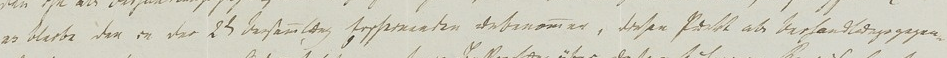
es bleibe den in der 2ten Versammlung Erscheinenden unbenommen, diesen Punkt als Verhandlungsgegen-
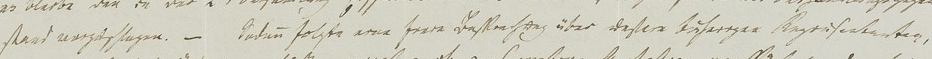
stand vorzuschlagen. – Sodann folgte eine freie Besprechung über unsere bisherigen Repräsentanten,
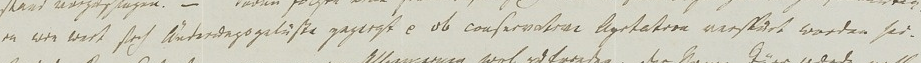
in wie weit sich Änderungsgelüste gezeigt & ob conservative Agitation verspürt worden sei.
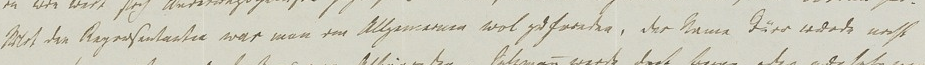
Mit den Repräsentanten war man im Allgemeinen wol zufrieden, der Name Dürr wurde nicht
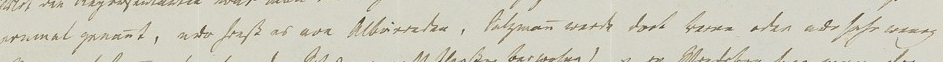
einmal genannt, nur hieß es von Albisrieden, Salzmann werde dort keine oder nur sehr wenig
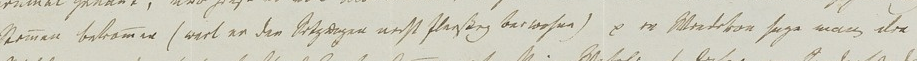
Stimmen bekommen (weil er den Sitzungen nicht fleißig beiwohne) in Wiedikon sage man, die
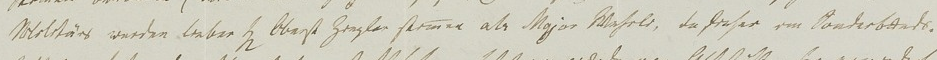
Militärs werden lieber Herrn Oberst Ziegler stimmen als Major Wehrli, da dieser im Sonderbunds-
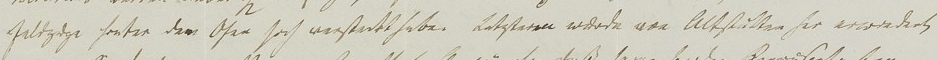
feldzuge hinter dem Ofen sich versteckt habe. Letzteren wurde von Altstätten her erwiedert,
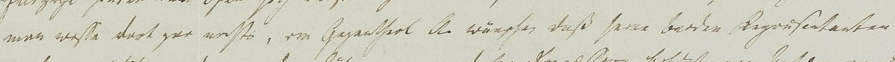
man wisse dort gar nichts, im Gegentheil A. wünsche, daß seine beiden Repräsentanten
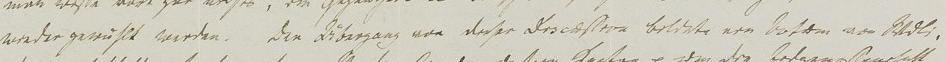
wieder gewählt werden. Den Übergang von dieser Discussion bildete ein Votum von Wdli,
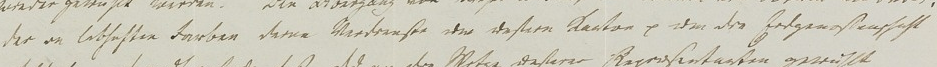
der in lebhaften Farben deine Verdienste um unsern Kanton & um die Eidgenossenschaft
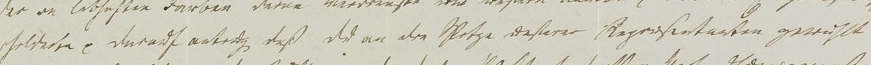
schilderte & darauf antrug, daß Du an die Spitze unserer Repräsentanten gewählt
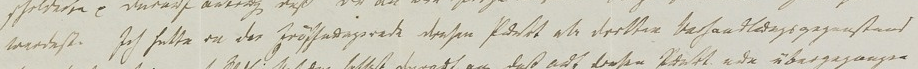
werdest. Ich hatte in der Eröffnungsrede diesen Punkt als dritten Verhandlungsgegenstand
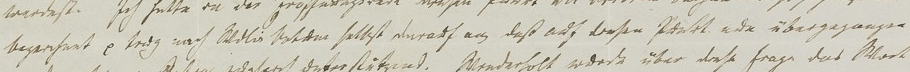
bezeichnet & trug nach Wdlis Votum selbst darauf an, daß auf diesen Punkt nun übergegangen
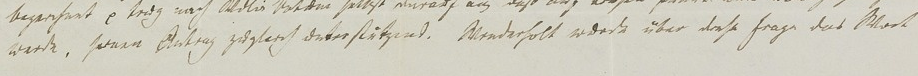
werde, seinen Antrag zugleich unterstützend. Wiederholt wurde über diese Frage das Wort
